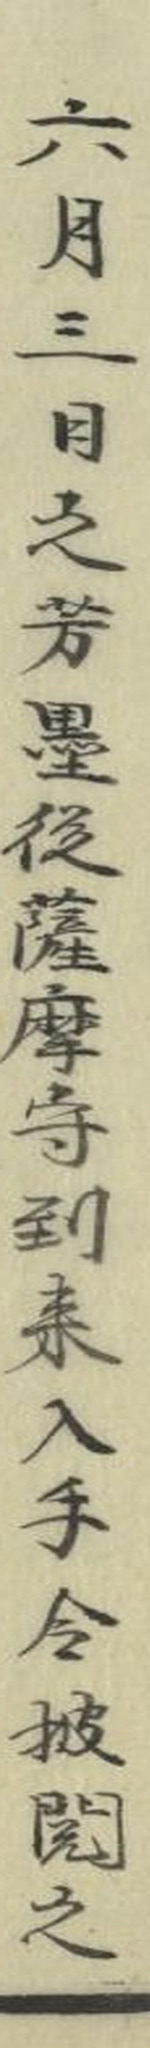六月三日之芳墨従薩摩守到来入手令被閲之
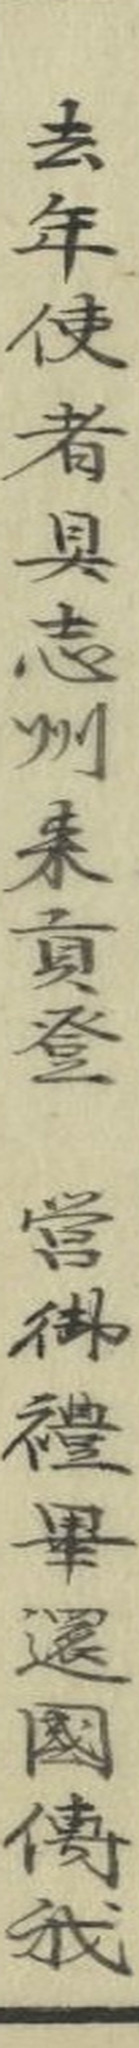去年使者具志州来貢登営御礼畢還国伝我
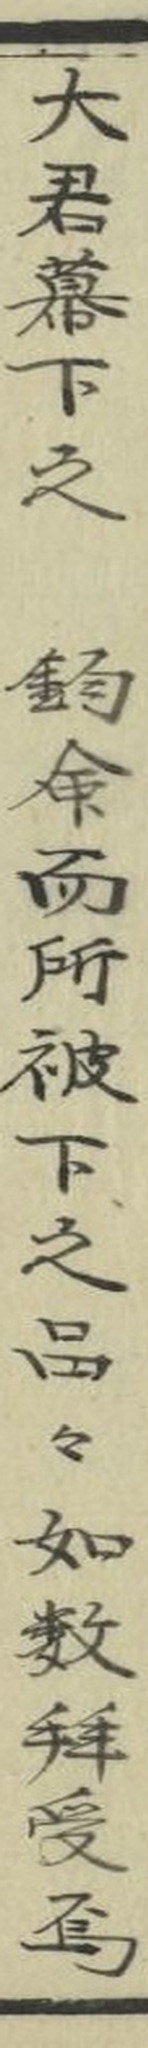大君幕下之欽命而所被下之品々如数拝受焉
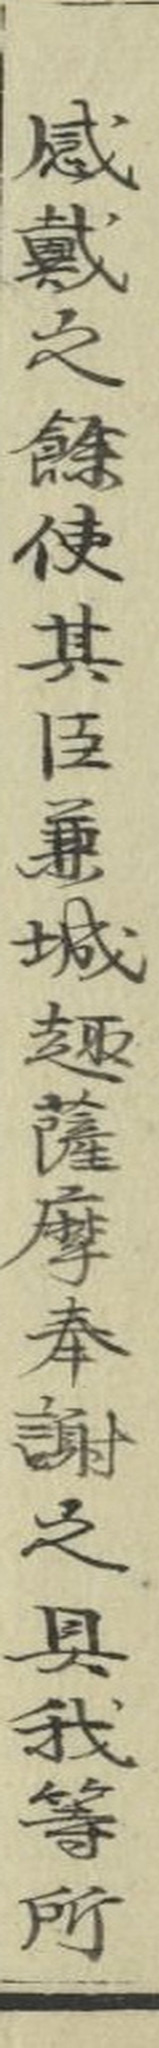感戴之余使其臣兼城趣薩摩奉謝之具我等所
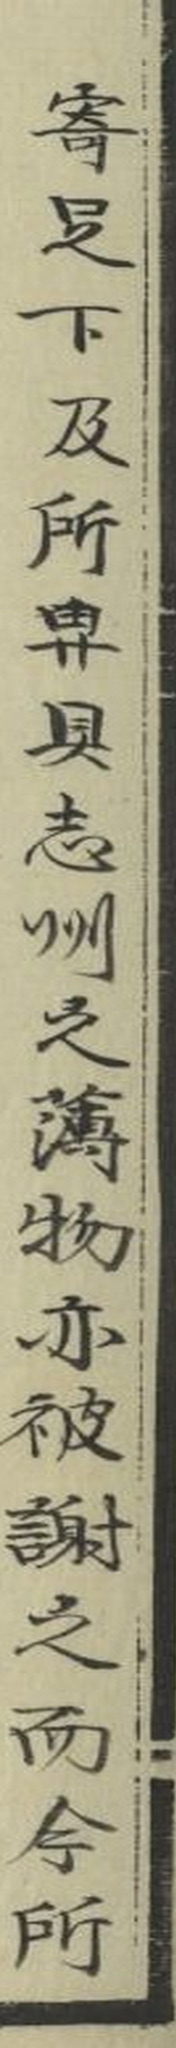寄足下及所卑具志州之薄物亦被謝之而今所
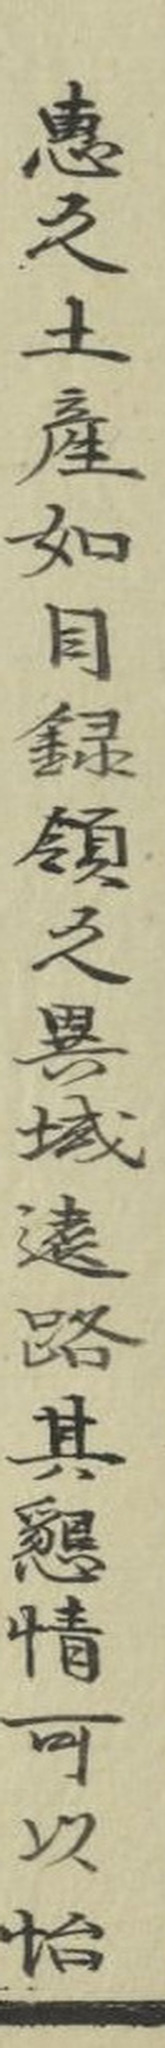恵之土産如目録領之異域遠路其懇情可以怡
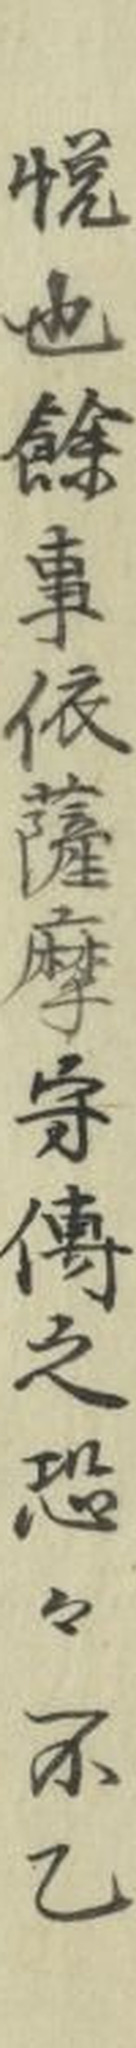悦也余事依薩摩守伝之恐々不乙
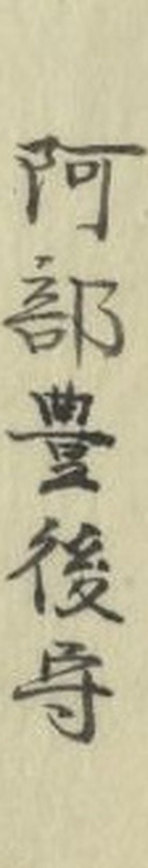阿部豊後守
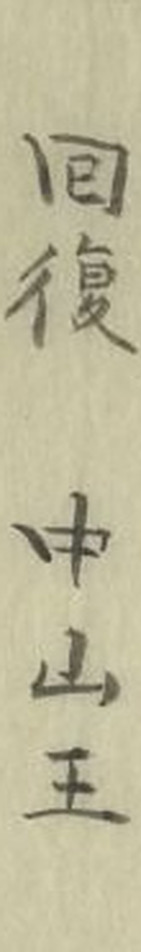回復中山王
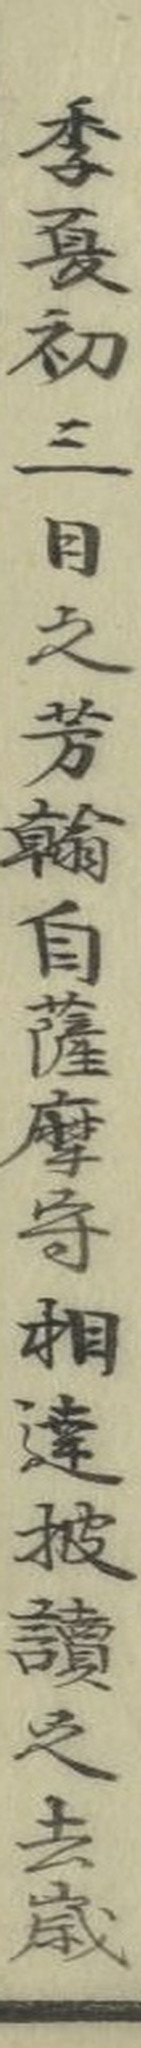季夏初三日之芳翰自薩摩守相達披読之去歳

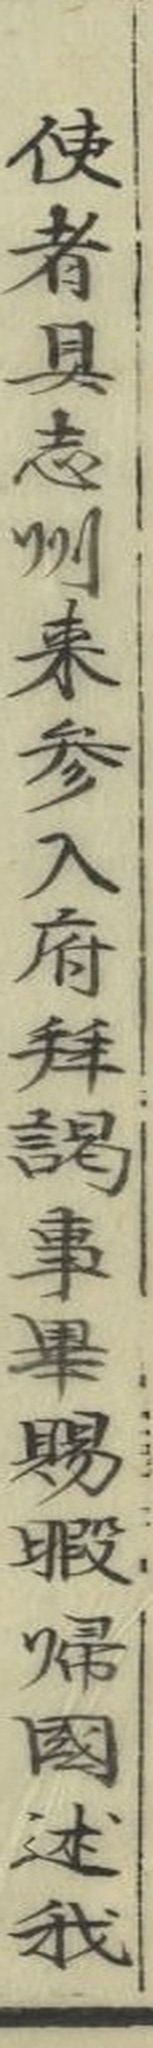使者具志州来参入府拝謁事畢賜暇帰国述我
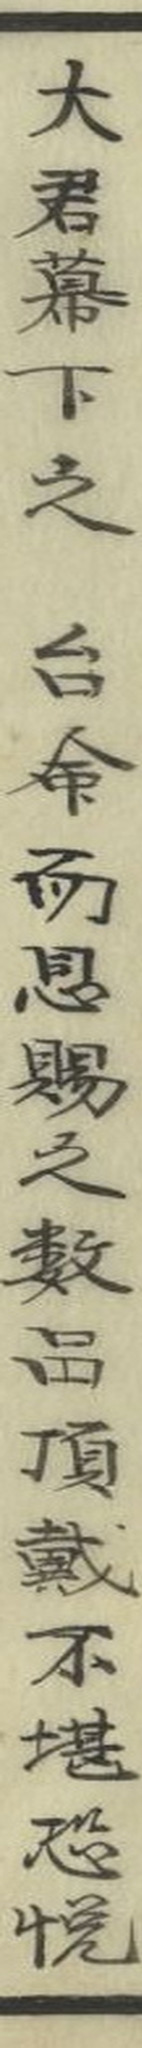大君幕下之台命而恩賜之数品頂戴不堪恐悦
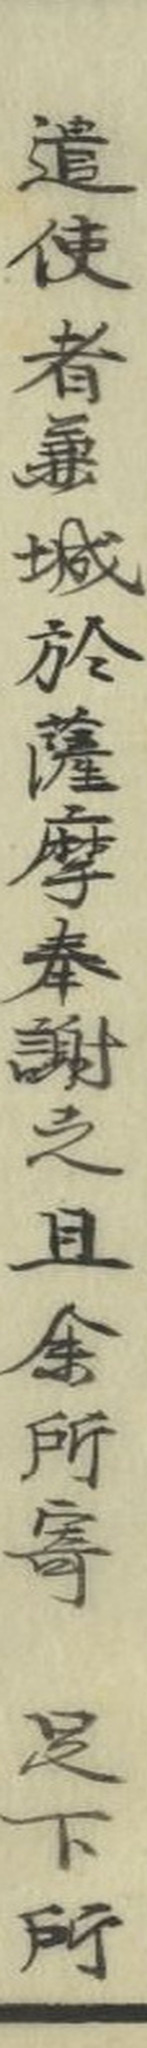遣使者兼城於薩摩奉謝之且余所寄足下所
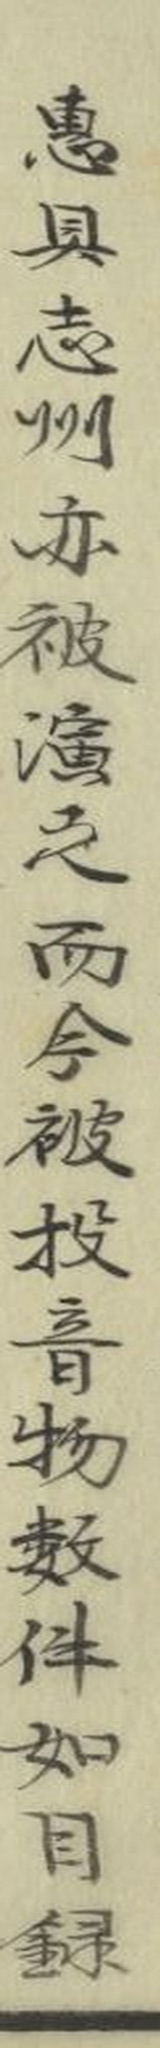恵具志州亦被演之而今被投音物数件如目録
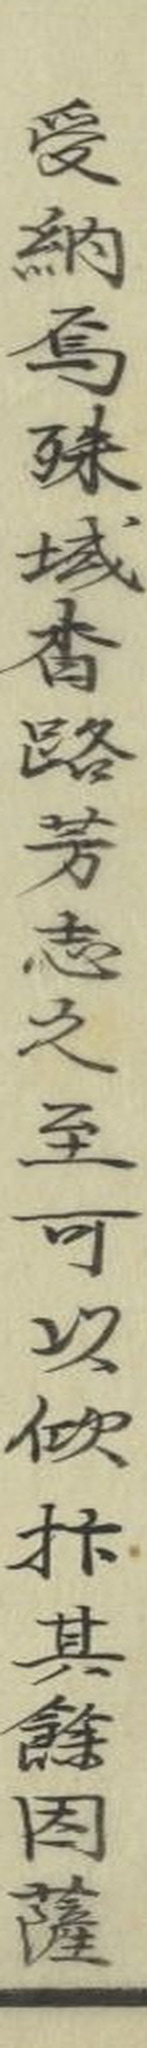受納焉殊域杳路芳志之至可以傾抃其余因薩
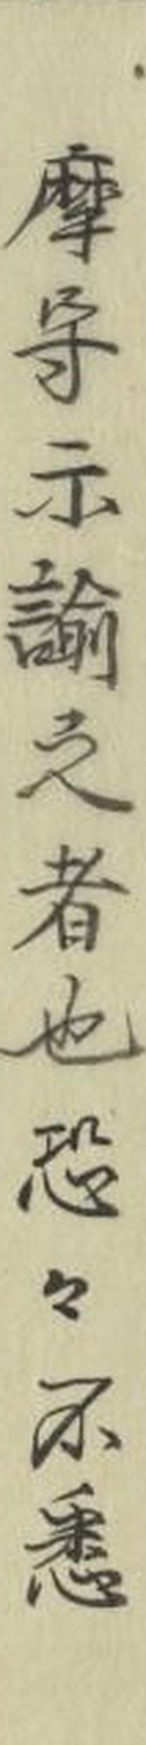摩守示論之者也恐々不悉
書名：琉球往来（上）
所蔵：University of the Ryukyus Library
